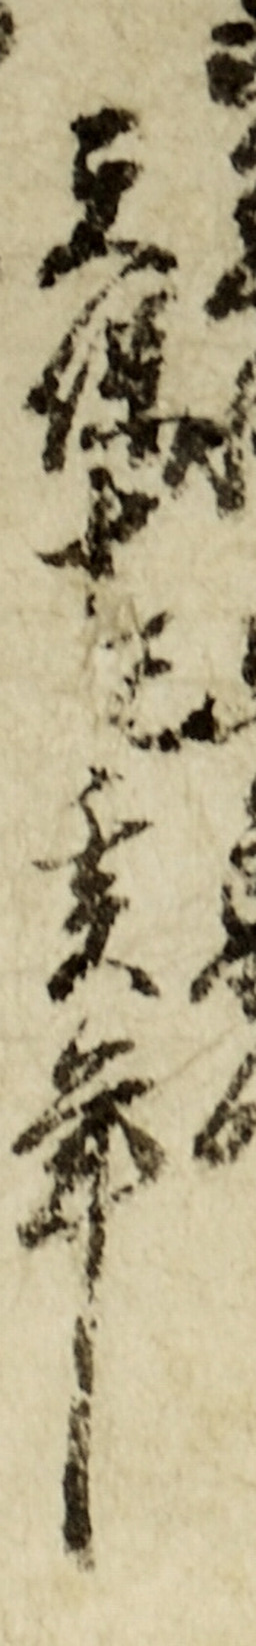天保十己亥年
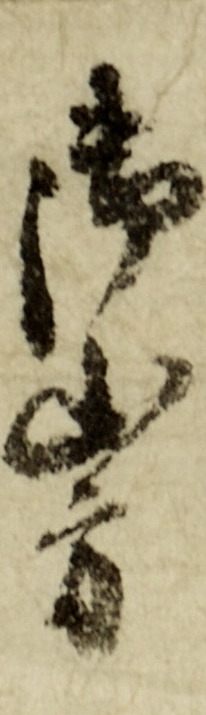御山方
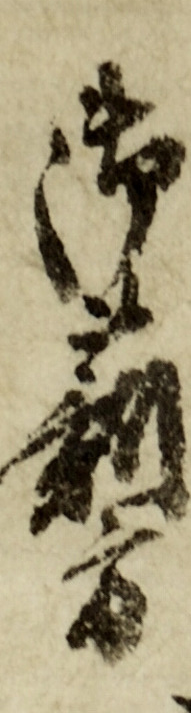御山方
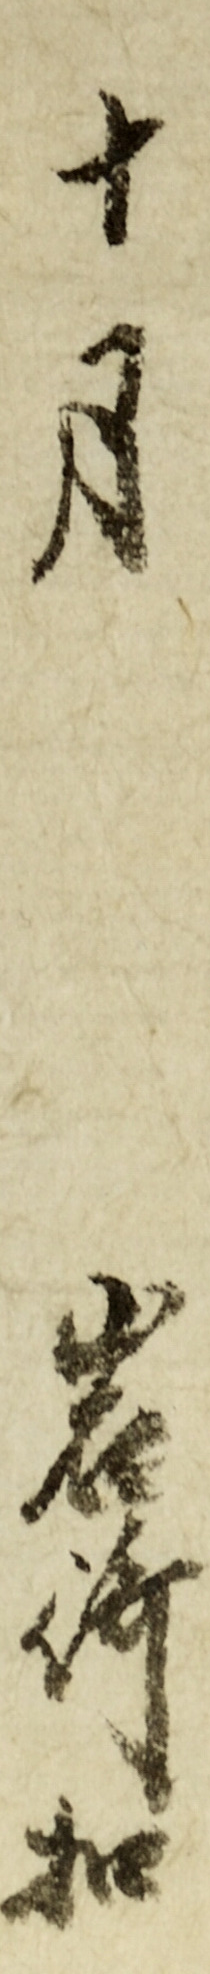十月岩崎扣
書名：御山方御薪方要集部録
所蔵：伊那市立高遠町図書館・合同会社AMANE
